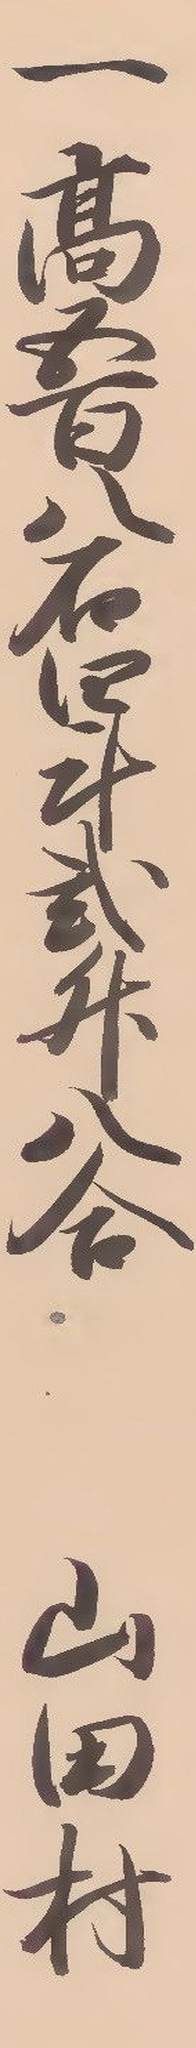一高五百八石四斗弐升八合山田村

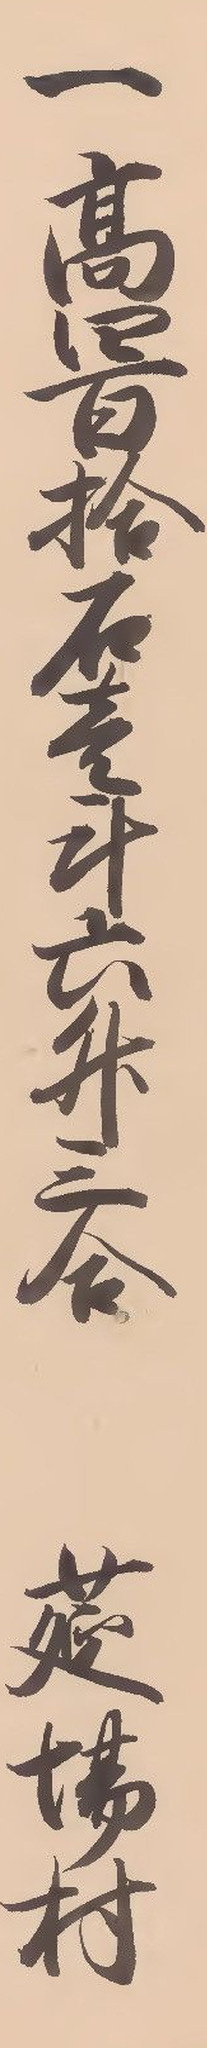一高四百拾石壱斗六升三合莚場村
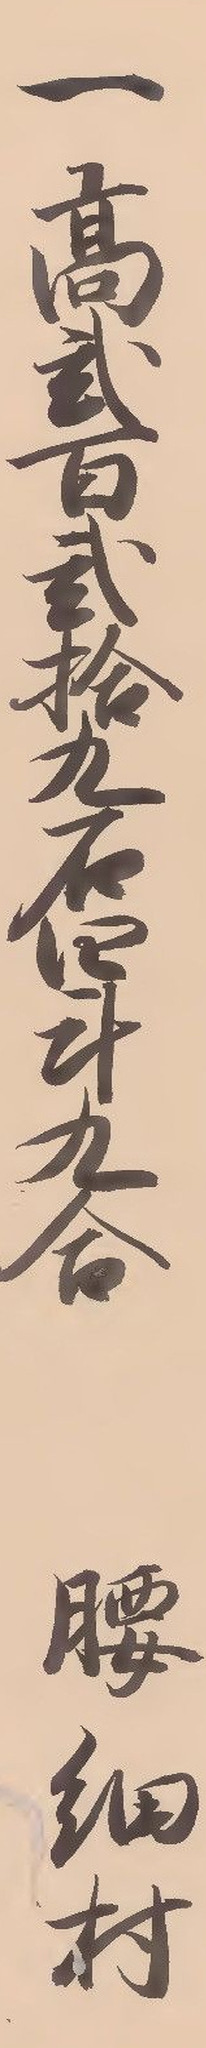一高弐百弐拾九石四斗九合腰細村
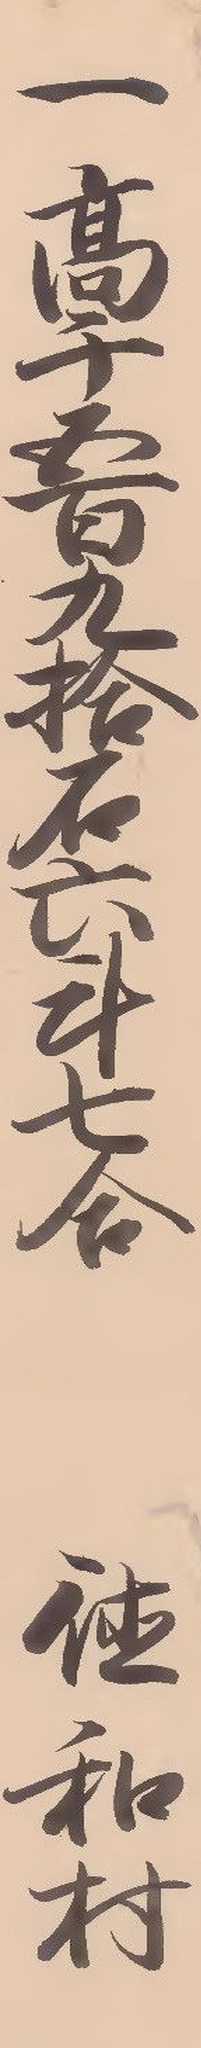一高千五百九拾石六斗七合徳和村
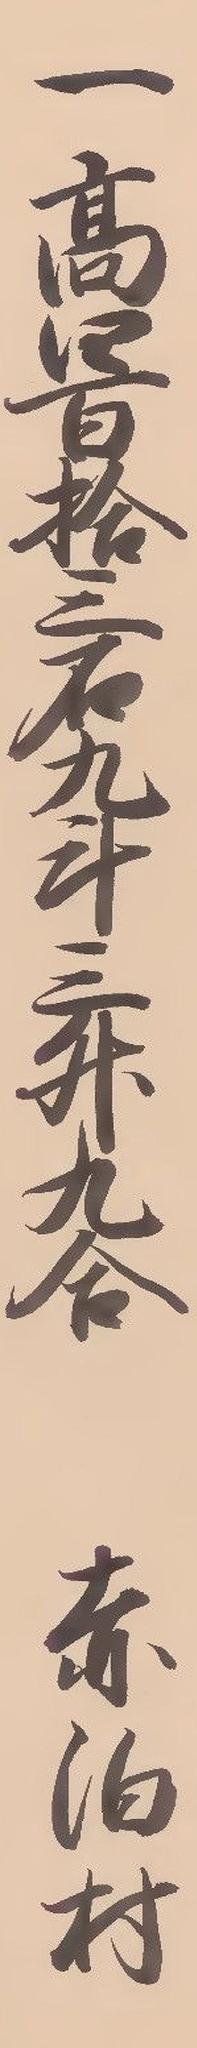一高四百拾三石九斗三升九合赤泊村
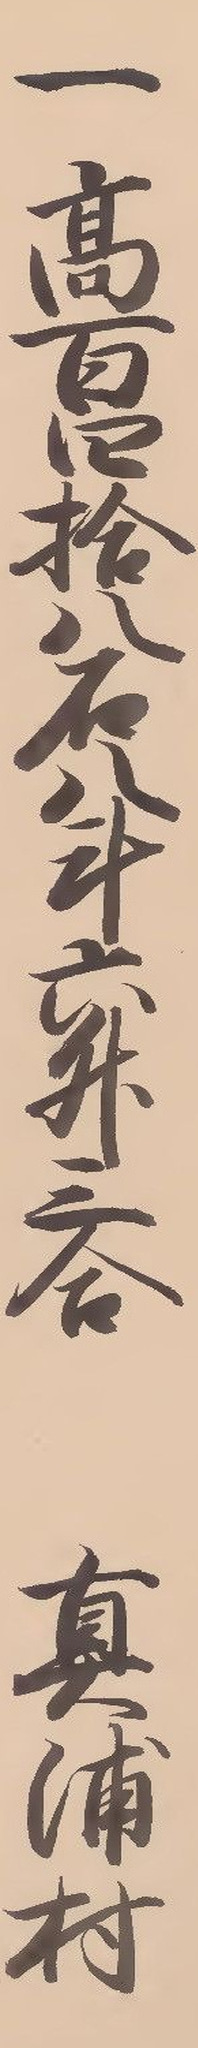一高百四拾八石八斗六升三合真浦村
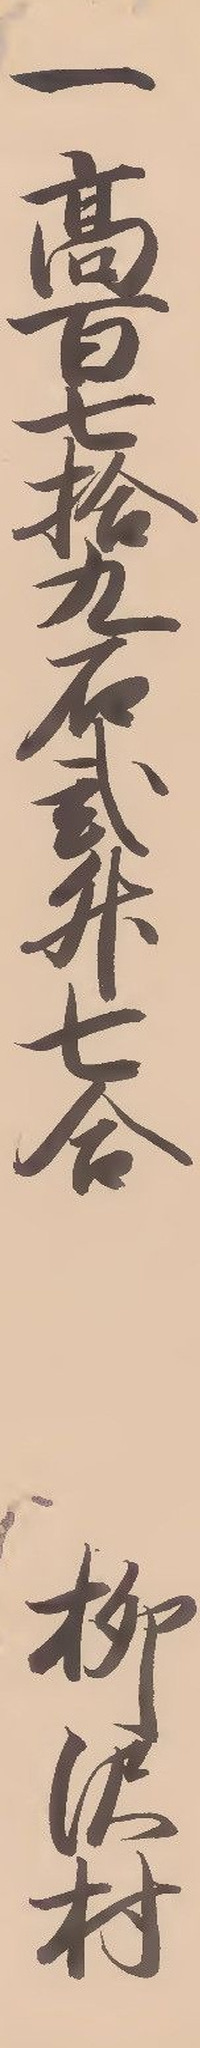一高百七拾九石弐升七合柳沢村
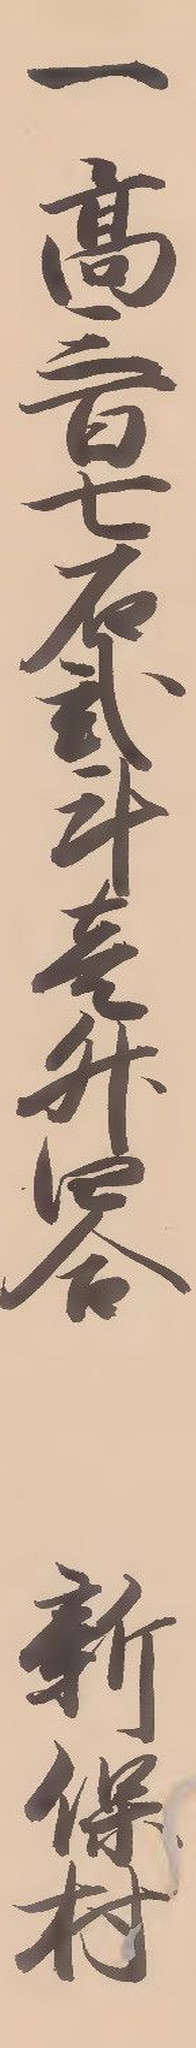一高三百七石弐斗壱升四合新保村
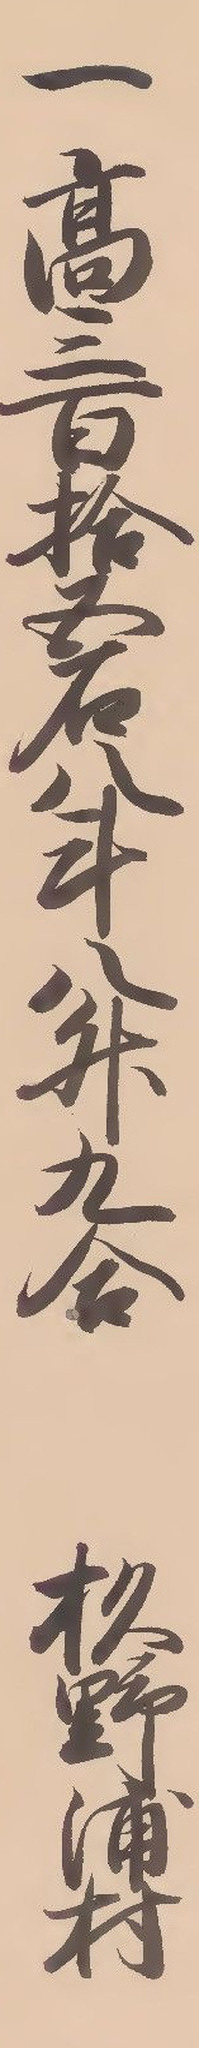一高三百拾五石八斗八升九合杉野浦村

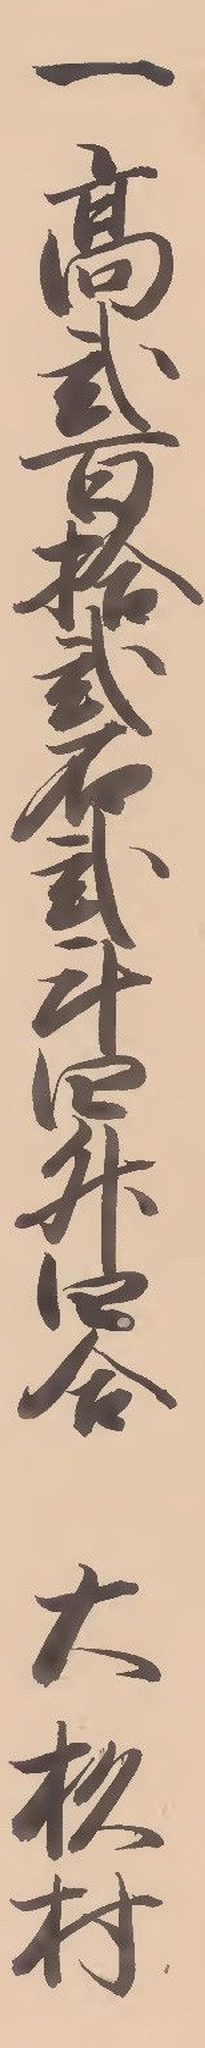一高弐百拾弐石弐斗四升四合大杉村
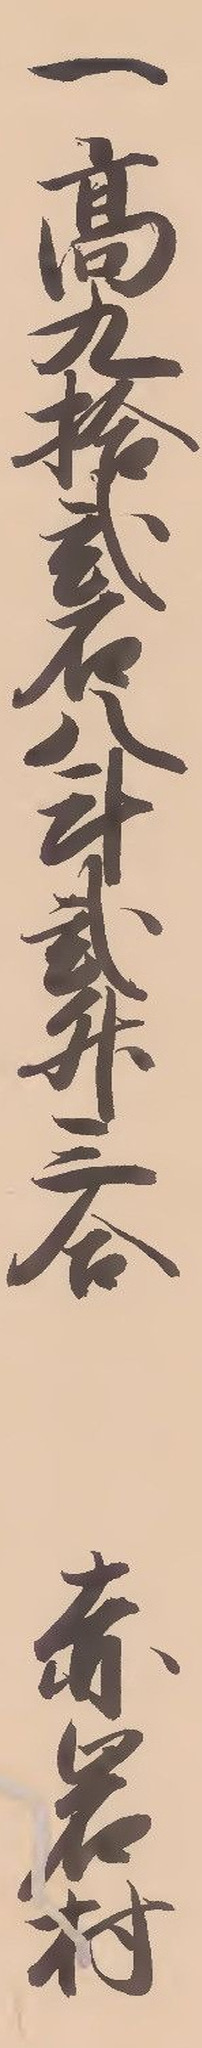一高九拾弐石八斗弐升三合赤岩村
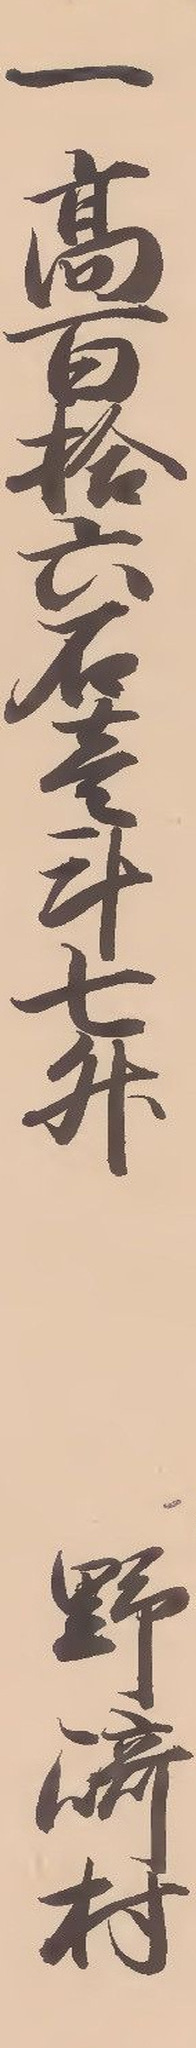一高百拾六石壱斗七升野崎村
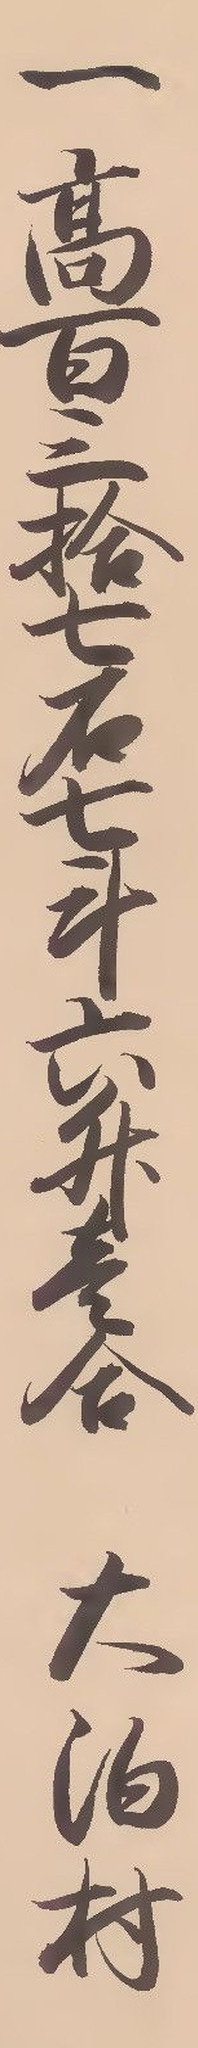一高百三拾七石七斗六升壱合大泊村
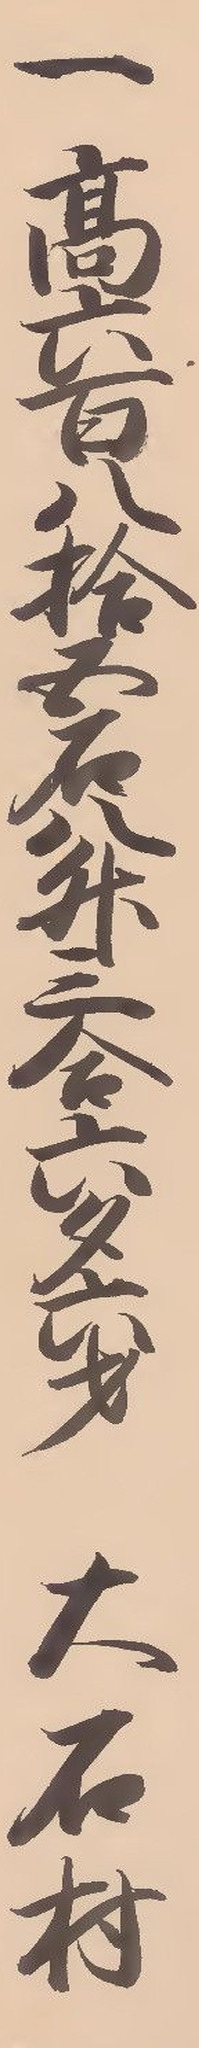一高六百八拾五石八升三合六勺六才大石村
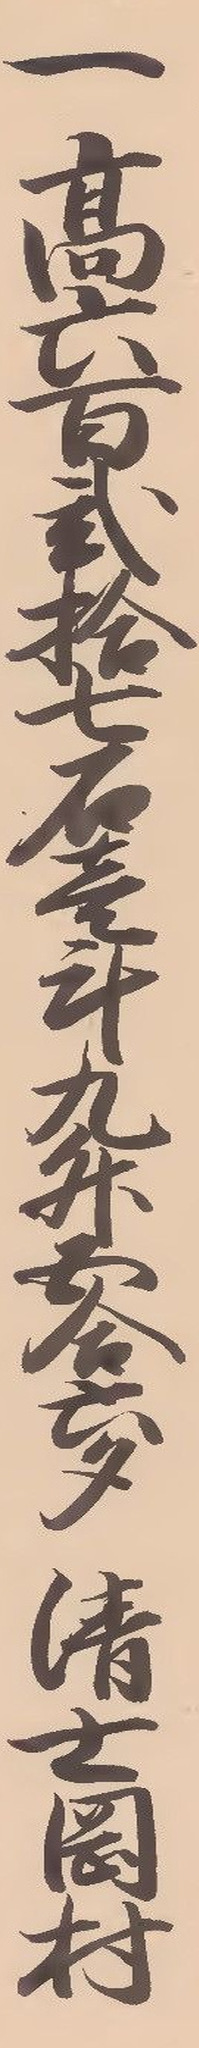一高六百弐拾七石壱斗九升五合六勺清士岡村
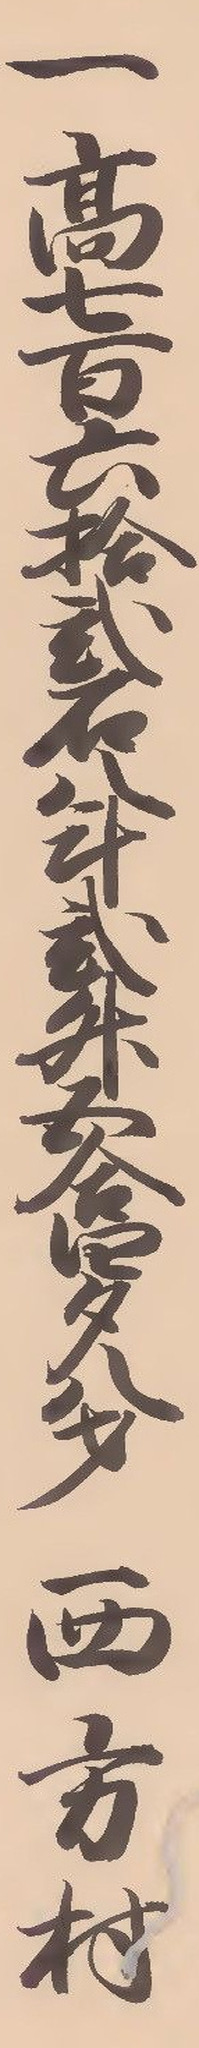一高七百六拾弐石八斗弐升五合四勺八才西方村
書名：佐渡国郷帳
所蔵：国立公文書館 National Archives of Japan
